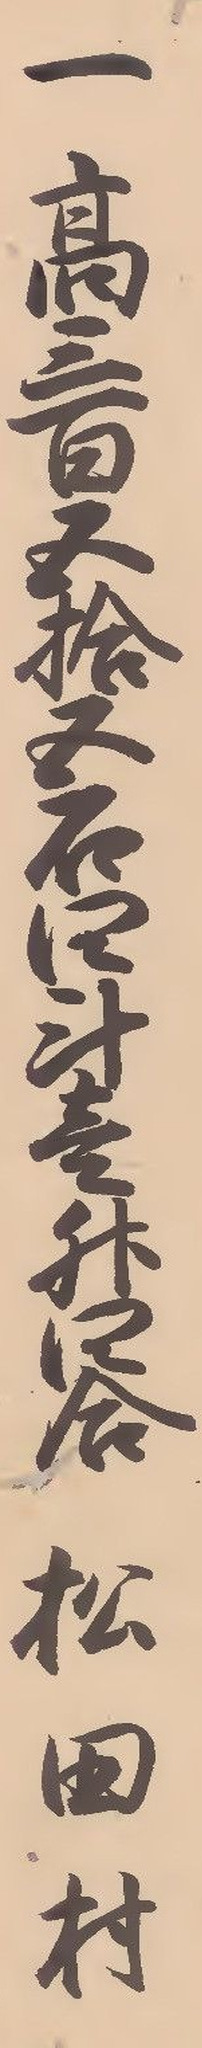一高三百五拾五石四斗壱升四合松田村

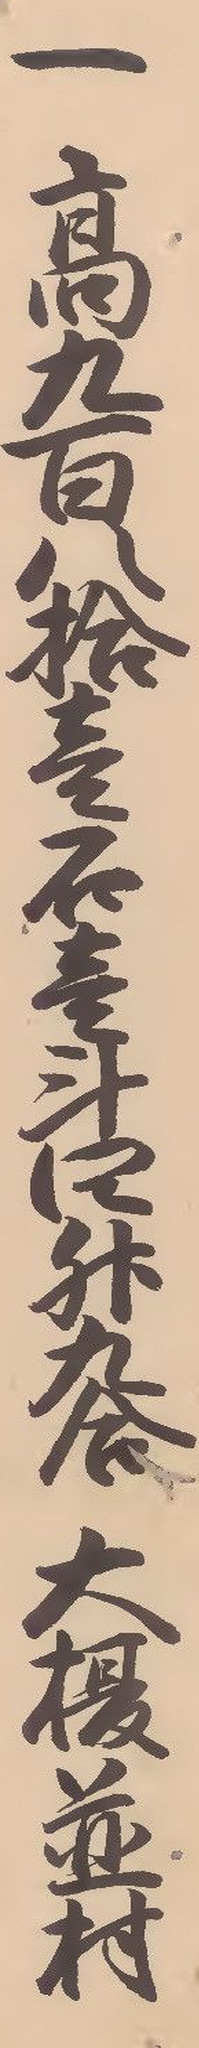一高九百八拾壱石壱斗四升九合大榎並村
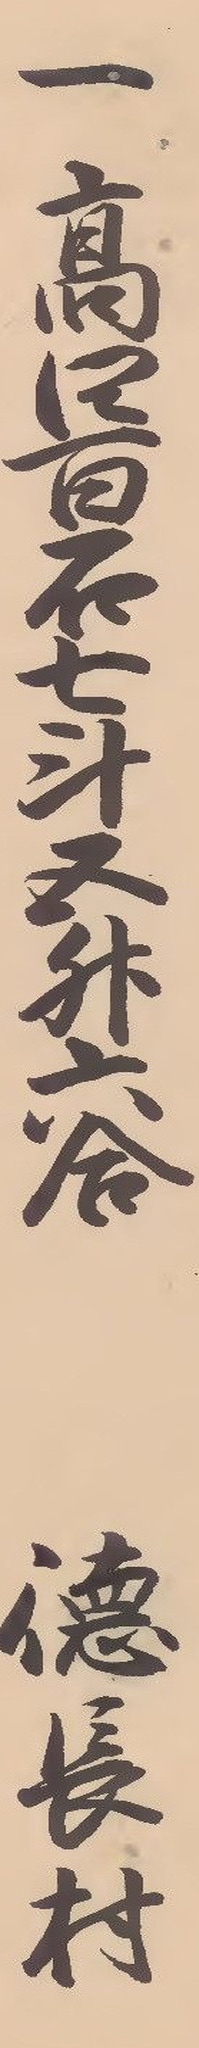一高四百石七斗五升六合徳長村
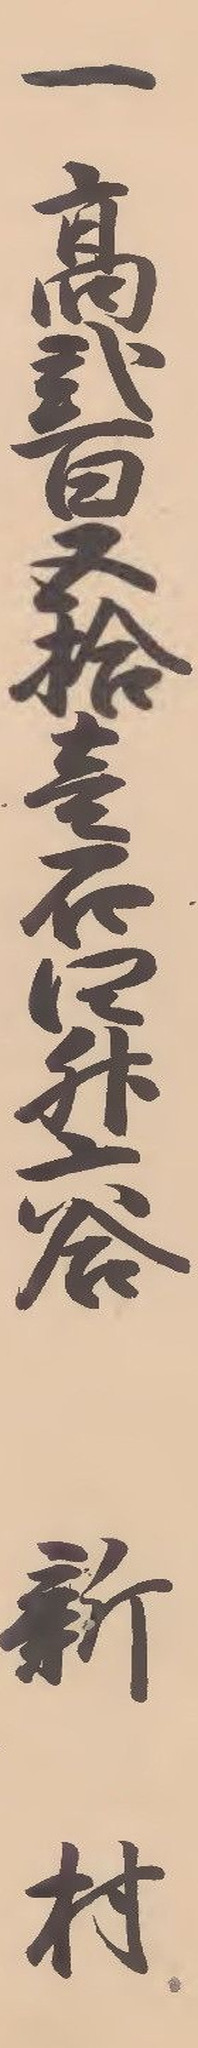一高弐百五拾壱石四升六合新村
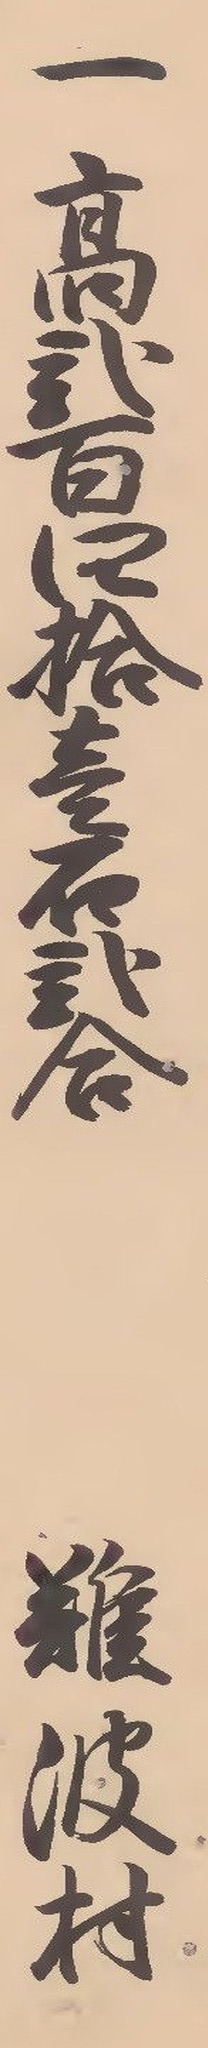一高弐百四拾壱石弐合難波村
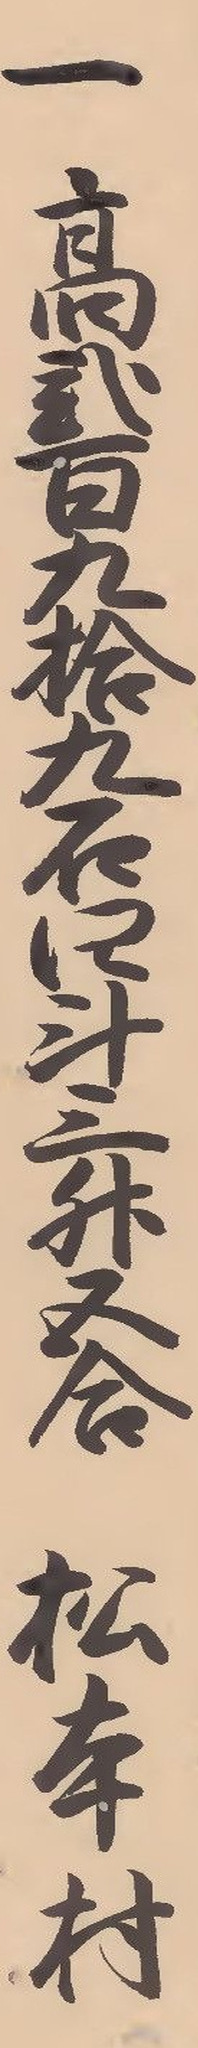一高弐百九拾九石四斗三升五合松本村
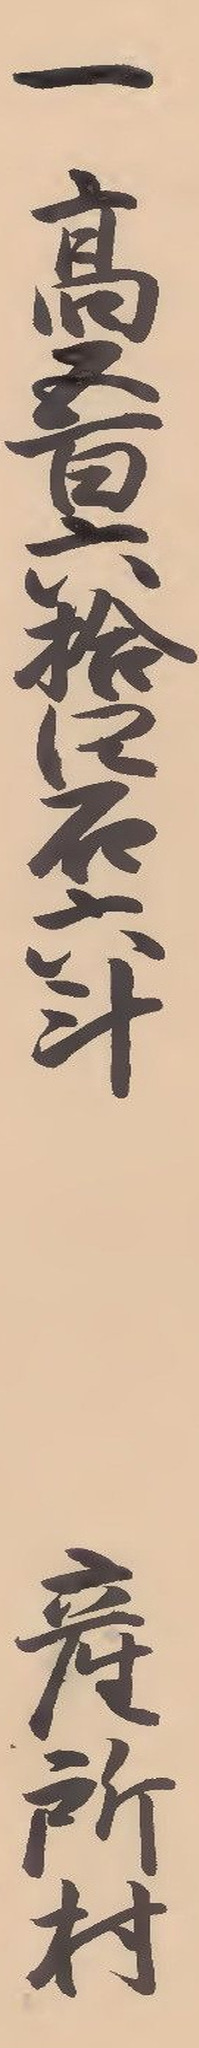一高五百六拾四石六斗産所村
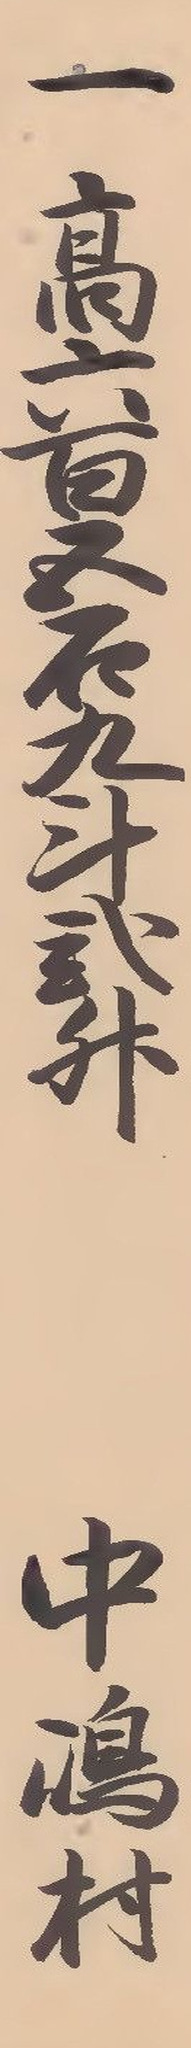一高六百五石九斗弐升中島村
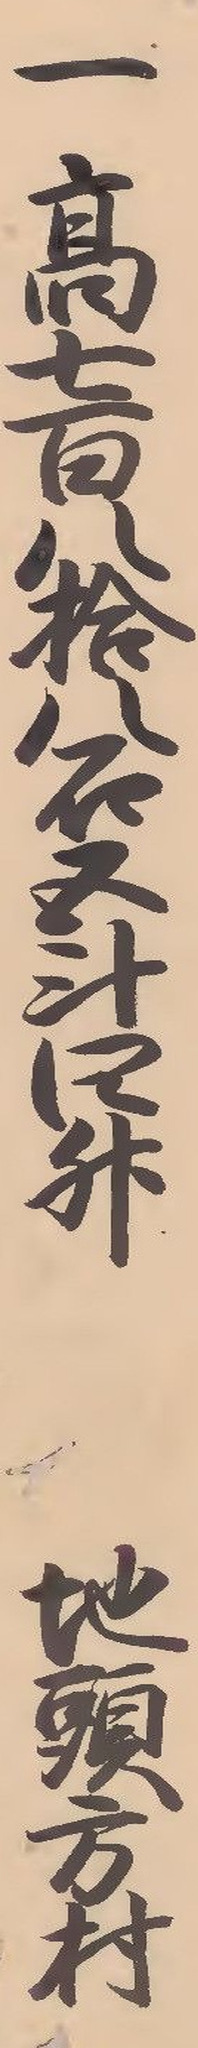一高七百八拾八石五斗四升地頭方村

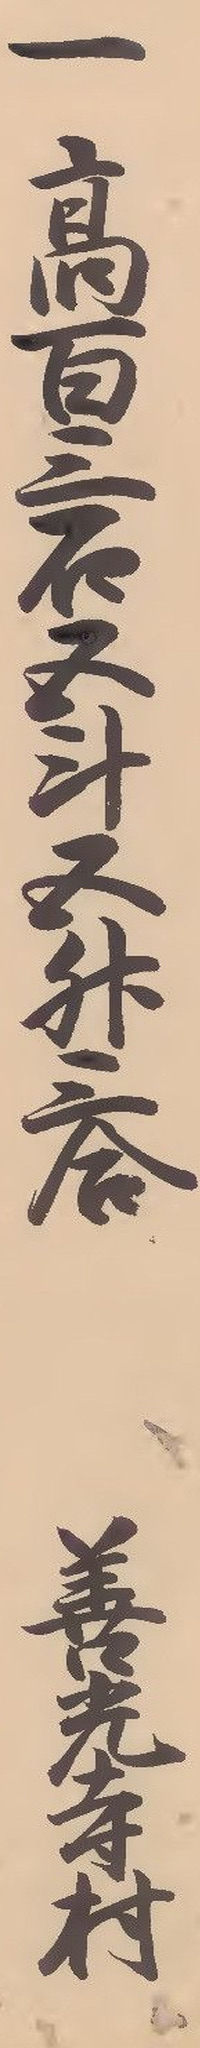一高百三石五斗五升三合善光寺村
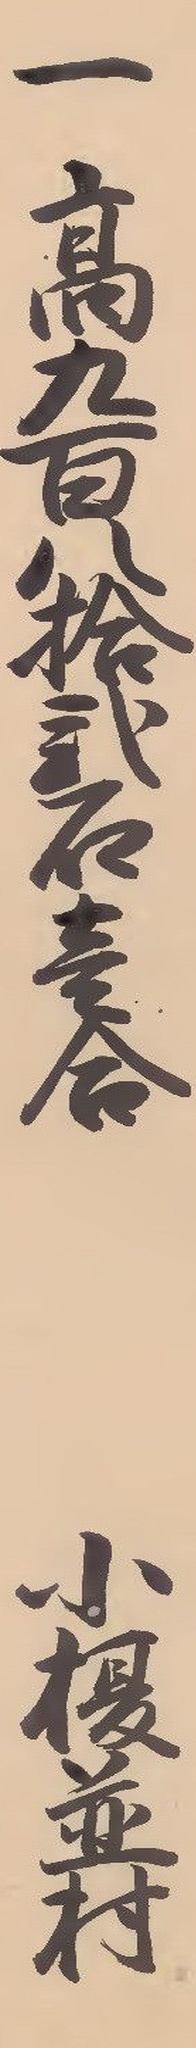一高九百八拾弐石壱合小榎並村
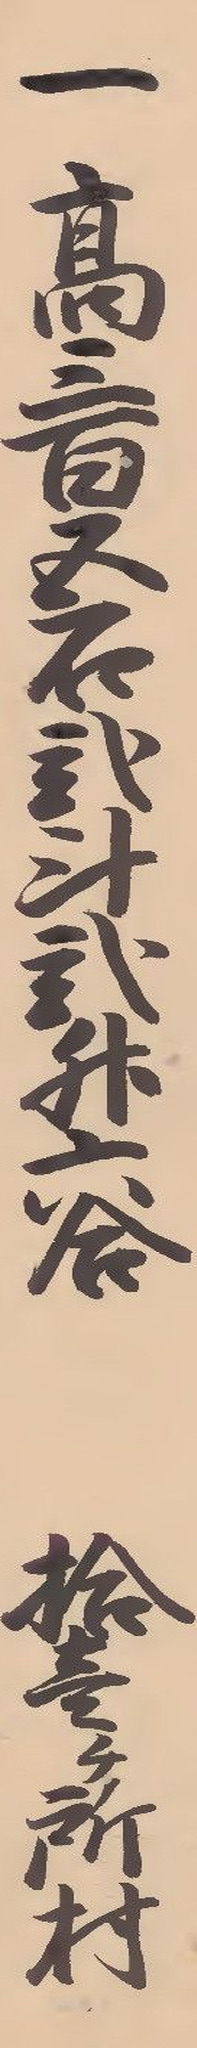一高三百五石弐斗弐升六合拾壱ヶ所村
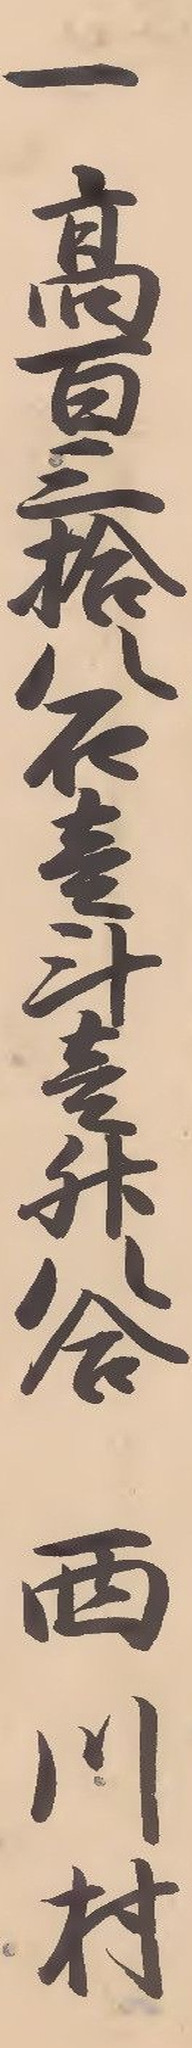一高百三拾八石壱斗壱升八合西川村
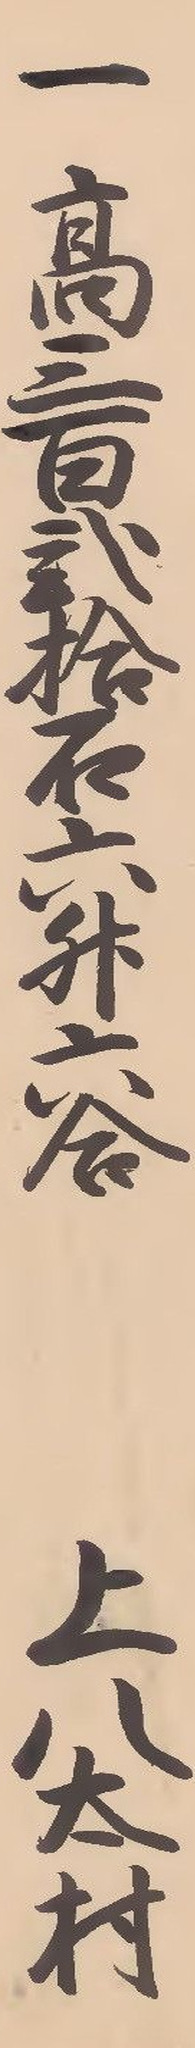一高三百弐拾石六升六合上八太村
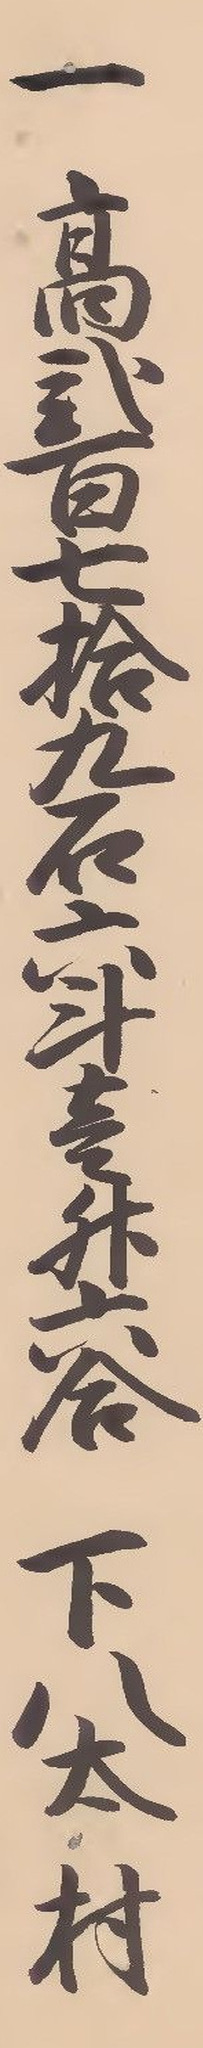一高弐百七拾九石六斗壱升六合下八太村
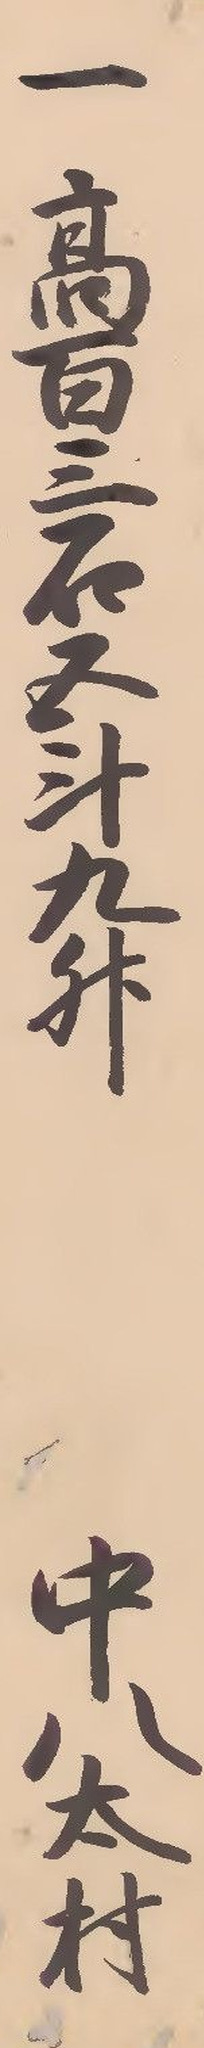一高百三石五斗九升中八太村
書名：淡路国郷帳
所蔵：国立公文書館 National Archives of Japan
